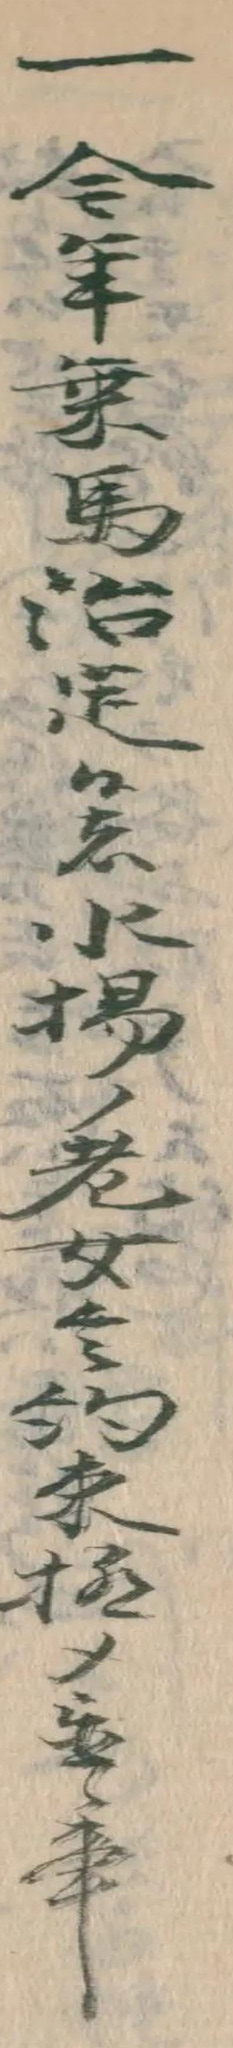一今年乗馬治定候者水揚ノ老女令約束極メ置候事
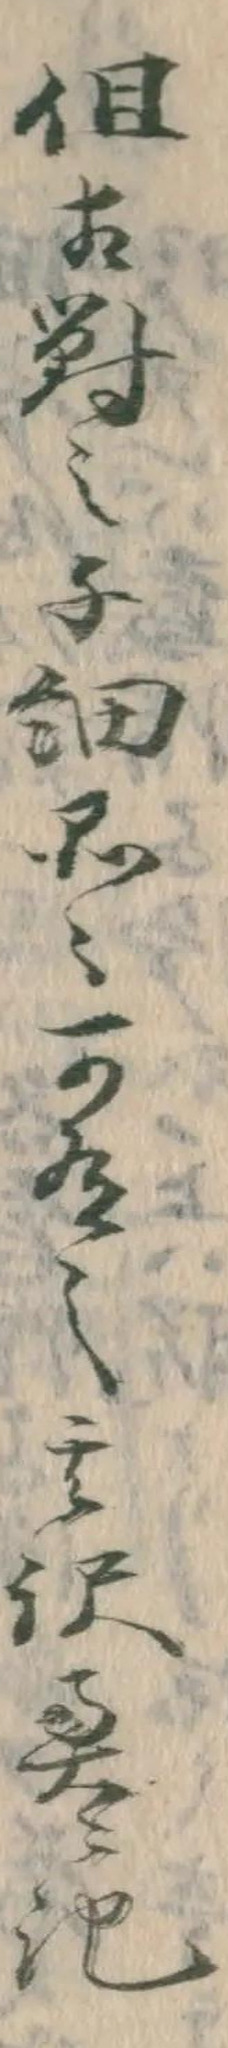但相対之子細品々可有之其訳奥ニ記
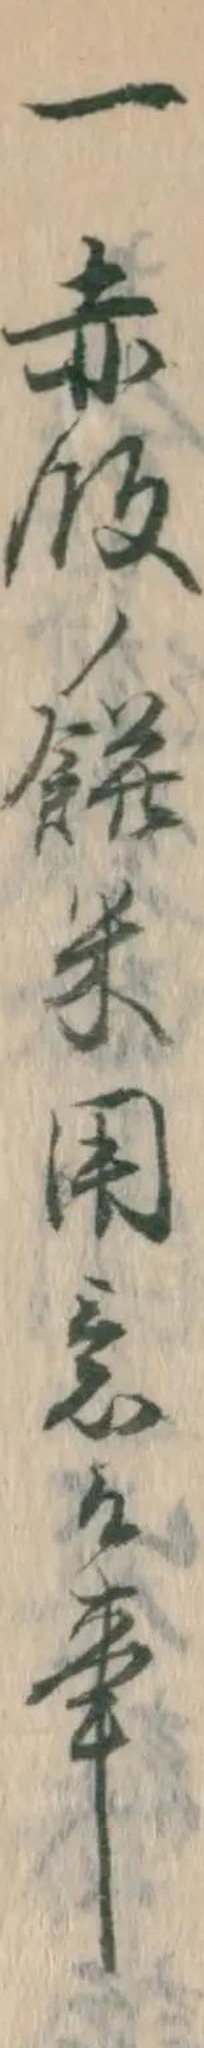一赤飯ノ餅米用意候事
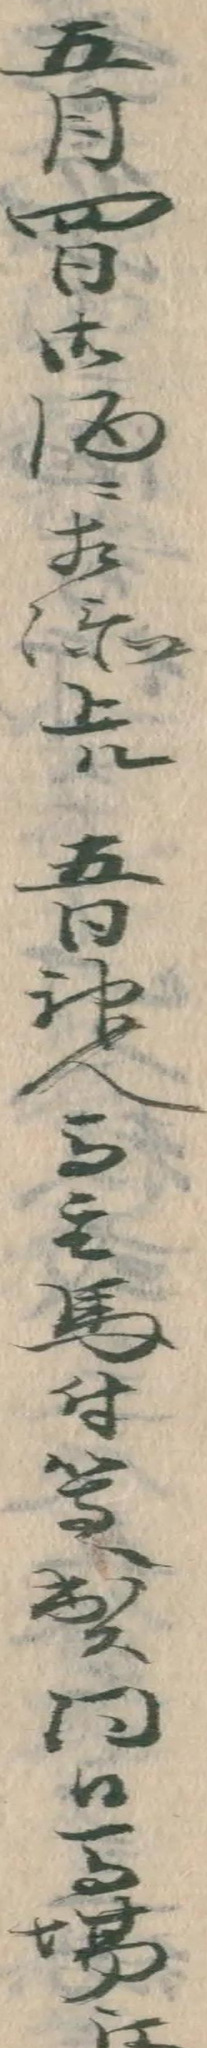五月四日御酒ニ相添上ル五日神人馬主馬付等へ出ス同日馬場江
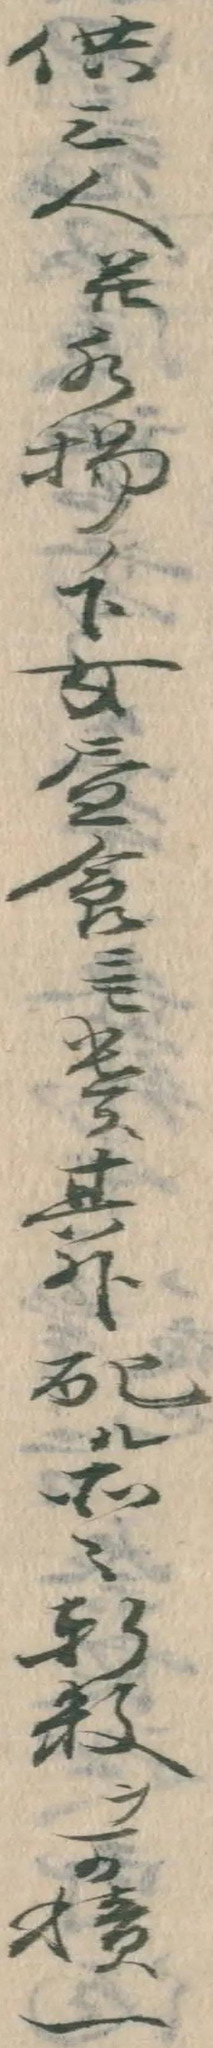供三人并水揚ノ下女昼食ニモ遣ス其外配ル所々軒数ヲ可積一
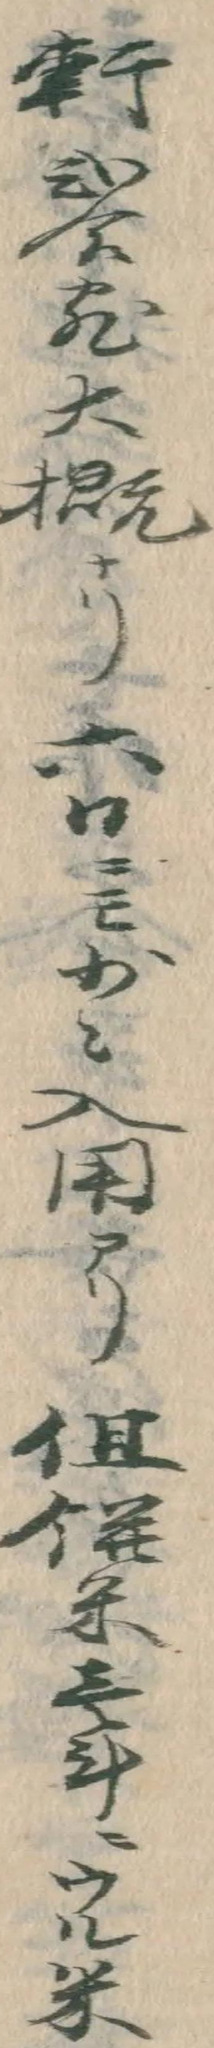軒弐合宛大概ナリ六日ニモ少々入用アリ但餅米壱斗ニウル米
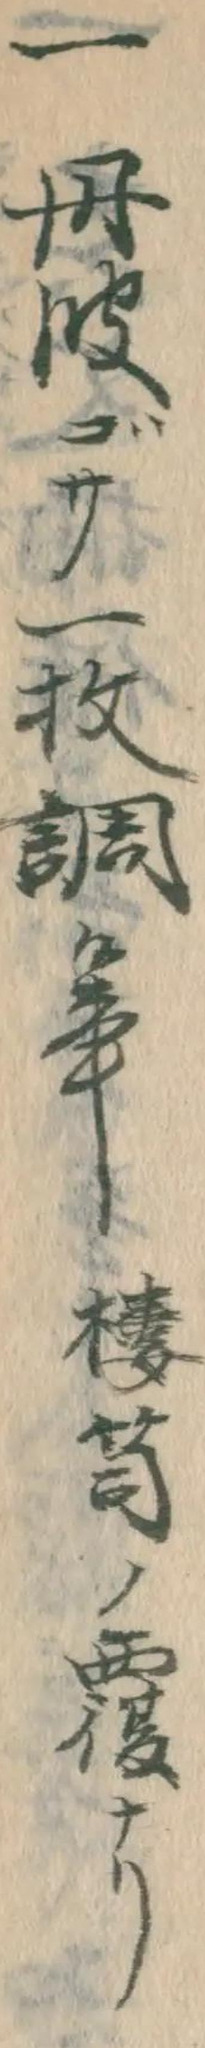一丹波ゴサ一枚調候事桜笥ノ覆ナリ

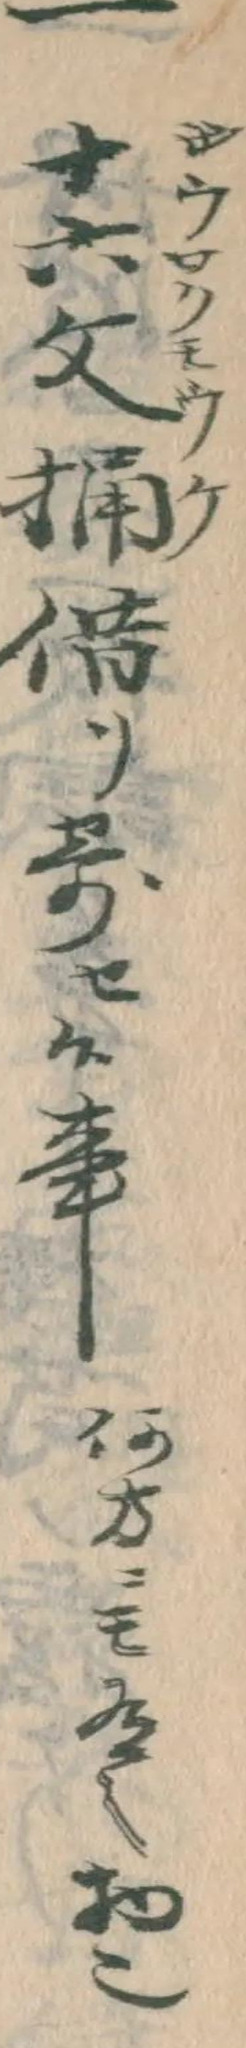一十六文桶借リ寄セ候事何方ニモ有之物也
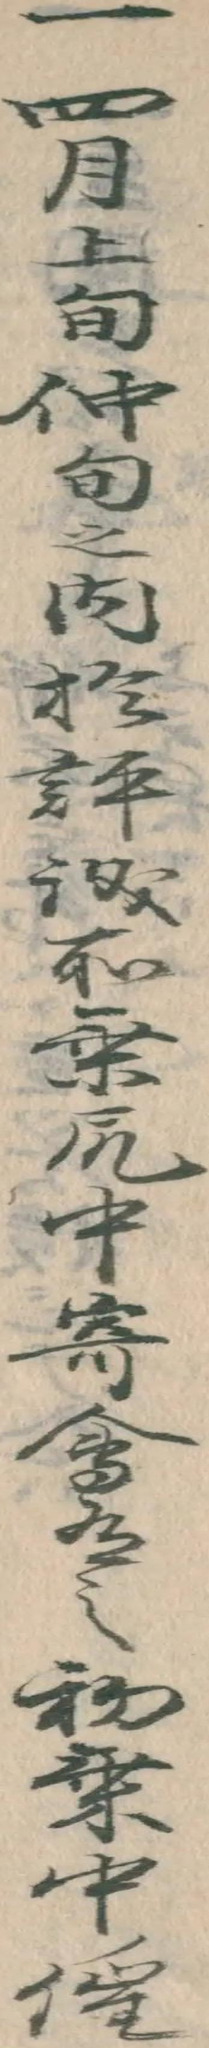一四月上旬仲旬之内於評議所乗尻中寄会有之初乗中ノ催
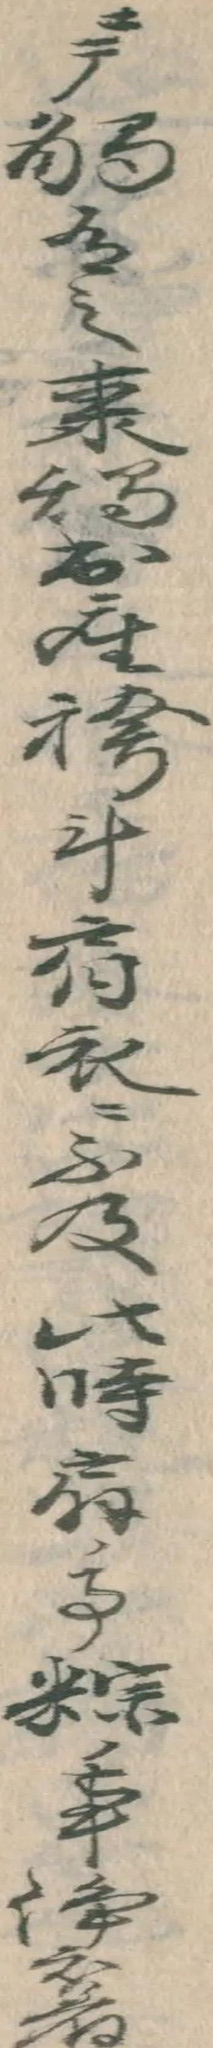ニテ触有之来触出座袴計肩衣ニ不及此時扇ノ事粽ノ事手浄衣着
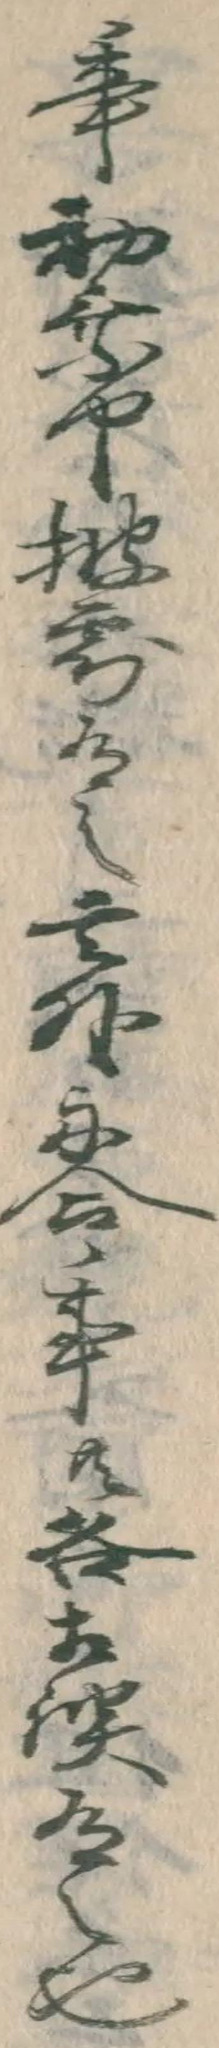ノ事初乗中披露有之其外舟合ノ事共各相談有之也
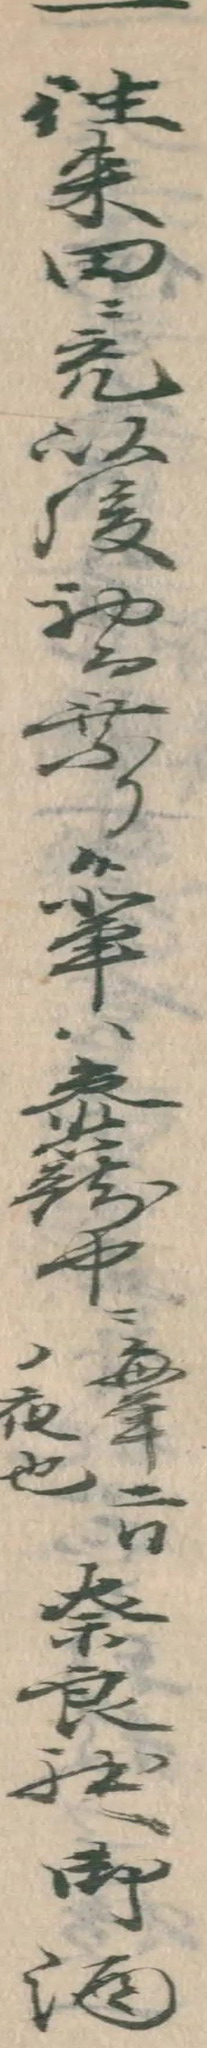一往来田ニ充以後初而乗り候輩ハ参籠中ニ毎年二日ノ夜也奈良社へ御酒
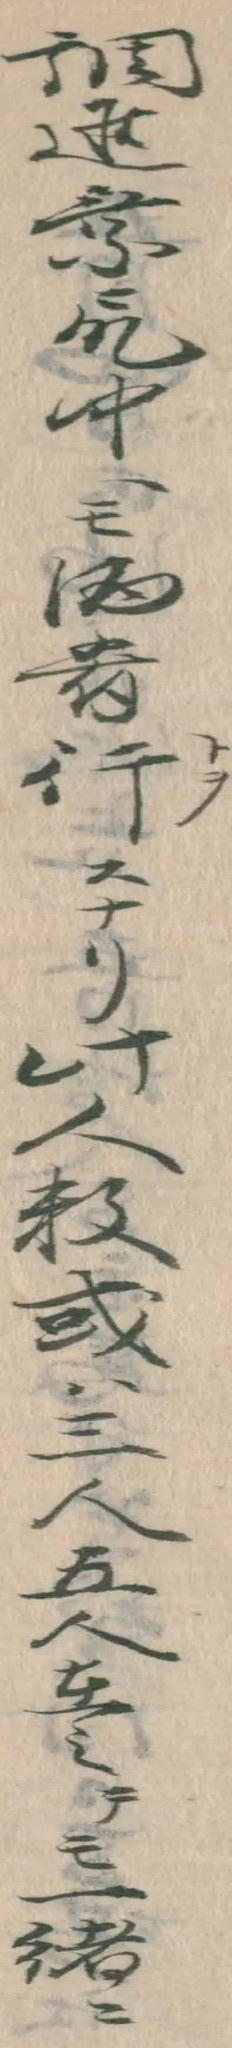調達乗尻中へモ酒肴行スナリ此人数或ハ三人五人在之テモ一緒ニ
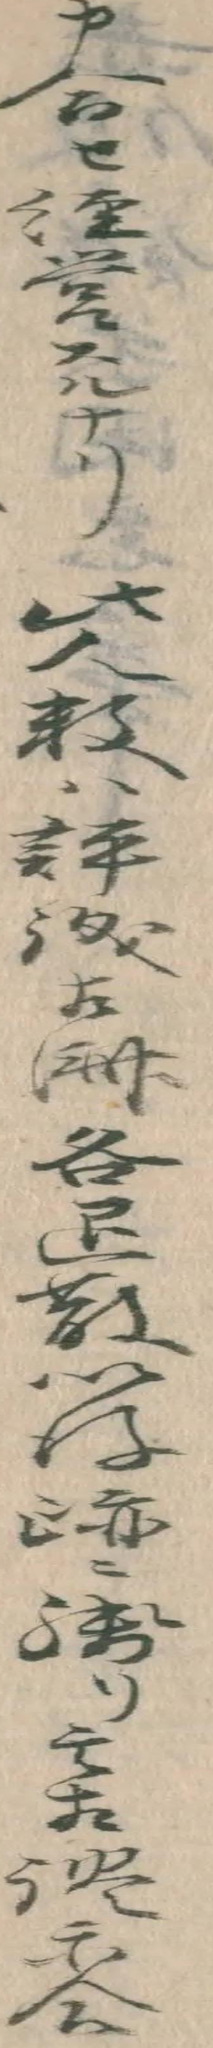申合セ経営スルナリ此人数ハ評議相済各退散以後跡ニ残リ其相談示合
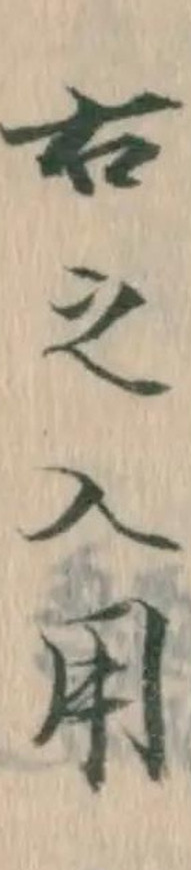右之入用
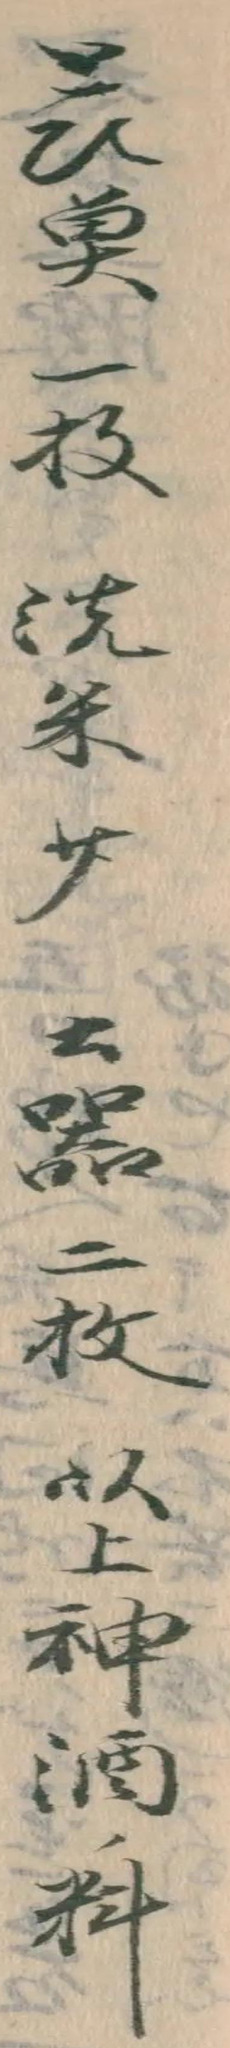とひ魚一枚洗米少土器二枚以上神酒ノ料
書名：賀茂社記録. 第11冊
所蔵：国立国会図書館 National Diet Library, JAPAN
